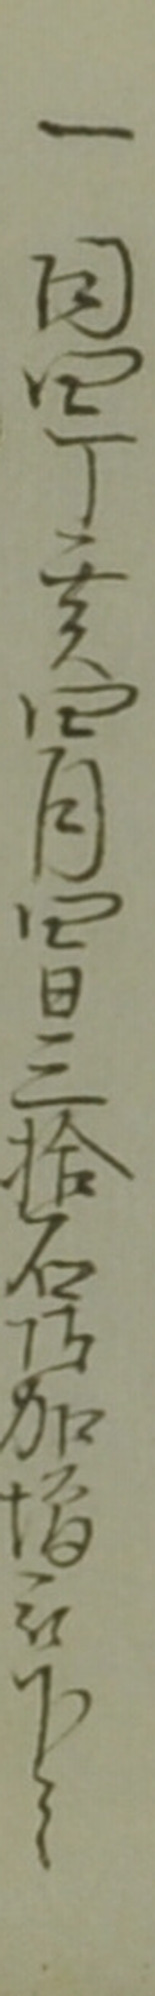一同四丁亥四月四日三拾石御加増被下之
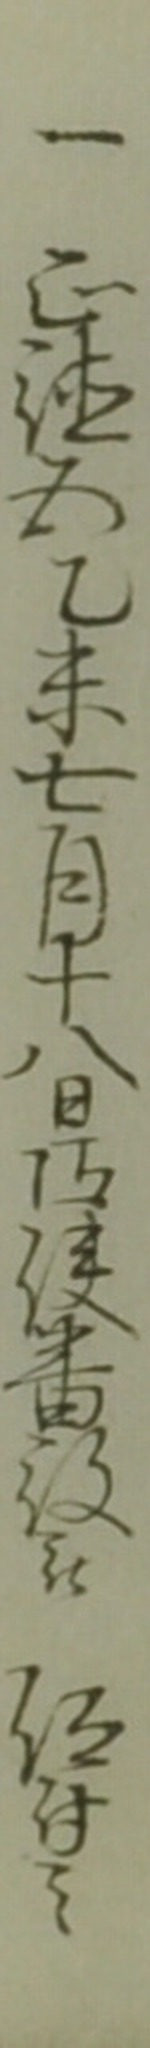一正徳五乙未七月十八日御使番役被仰付之
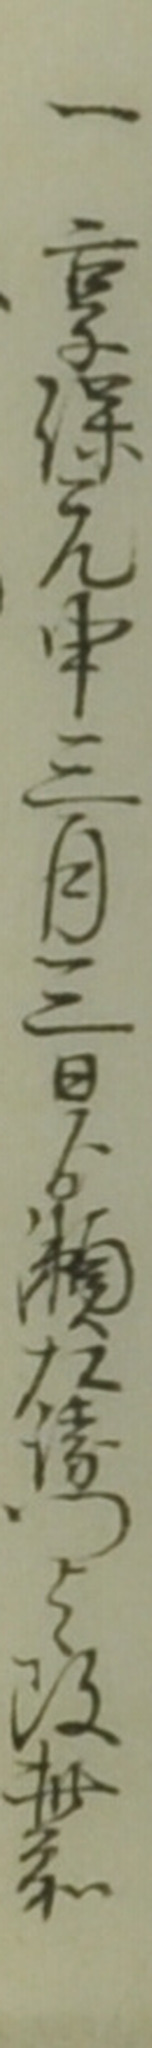一享保元申三月三日ゟ瀬左衛門与改此前
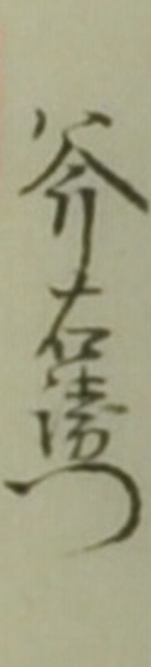斧右衛門

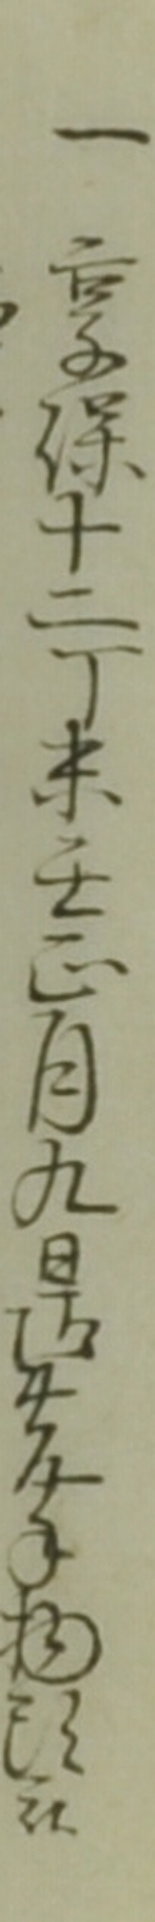一享保十二丁未閏正月九日御先手物頭被
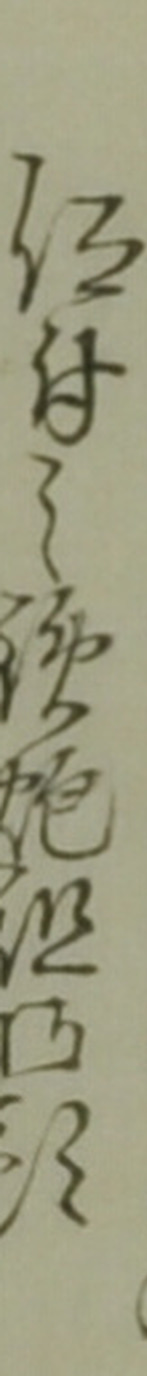仰付之鉄炮組御預
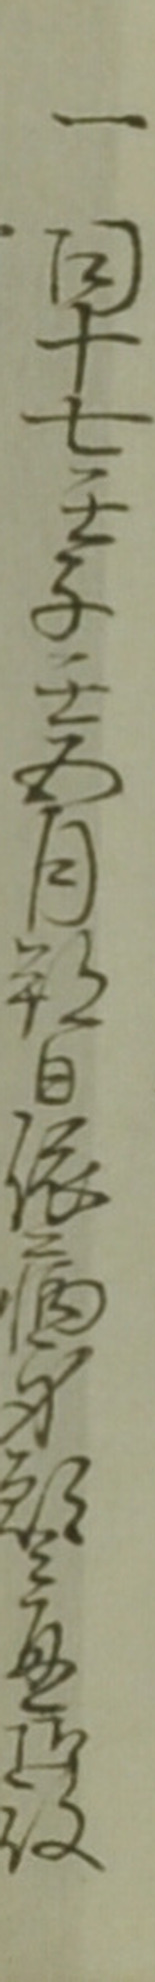一同十七壬子五月朔日依病身願之通御役
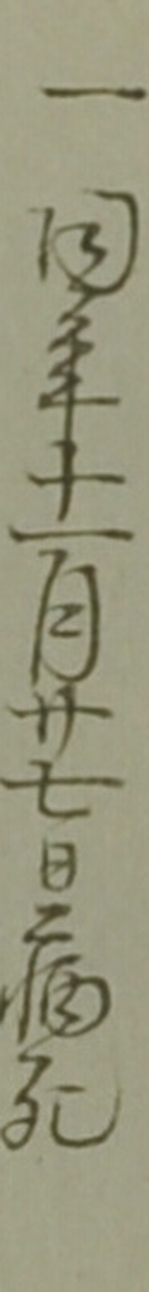一同年十一月廿七日病死
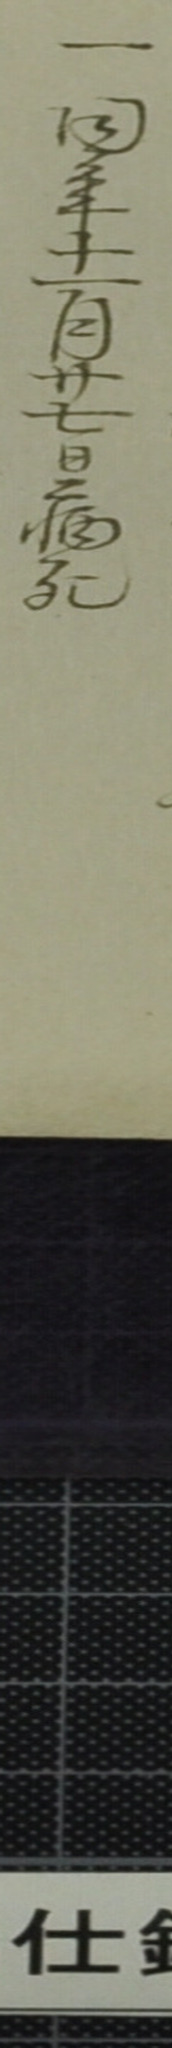一同年十一月廿七日病死
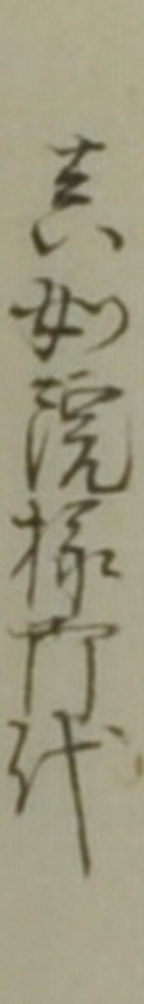真如院様御代
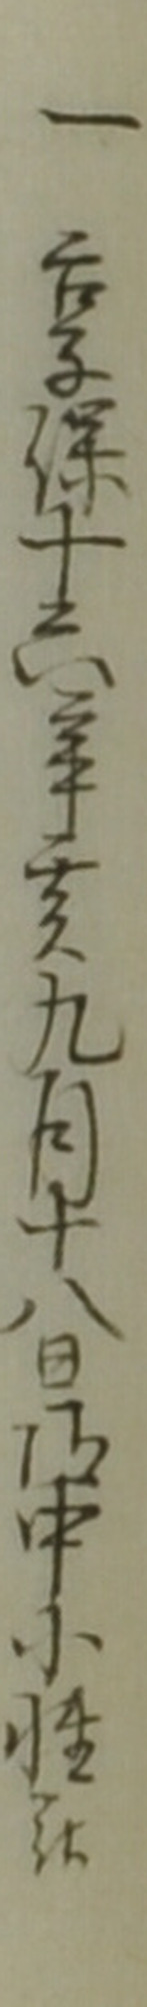一享保十六辛亥九月十八日御中小性被
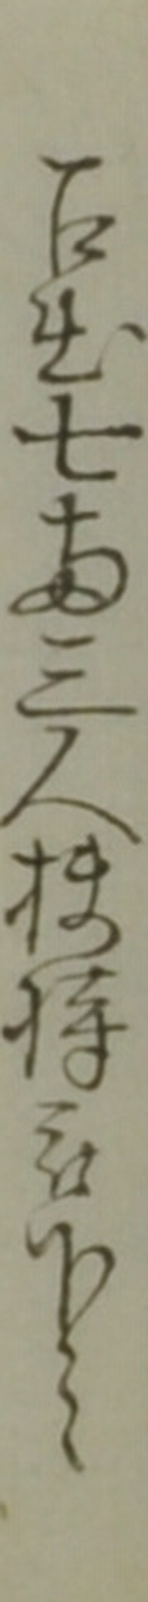召出七両三人扶持被下之
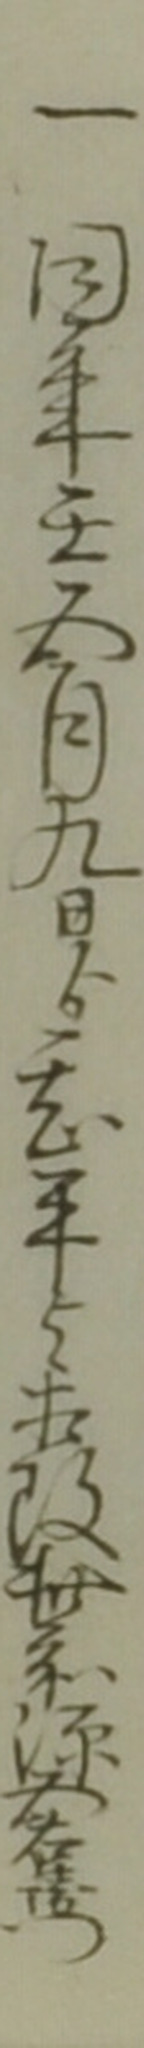一同年閏五月九日ゟ甚平与改此前源五右衛門
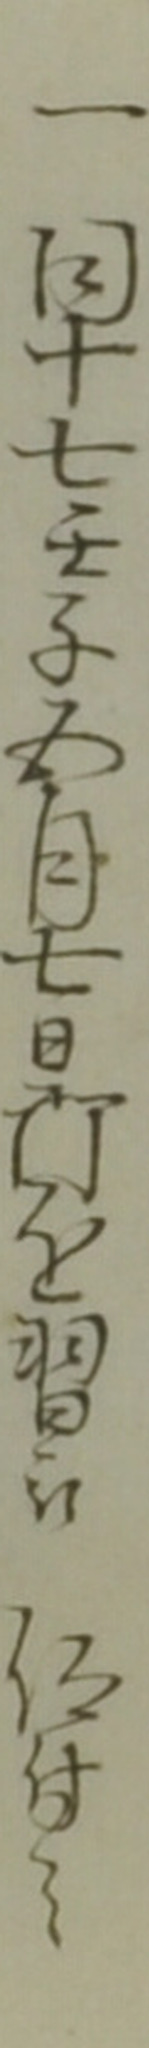一同十七壬子五月七日御近習被仰付之
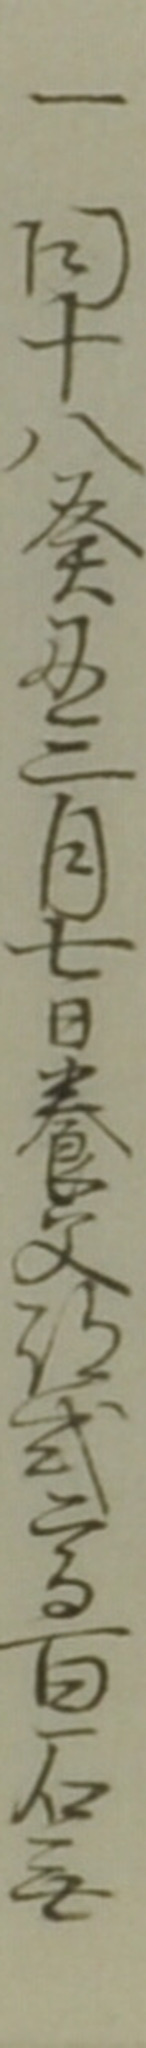一同十八癸丑三月七日養父跡式高百石無
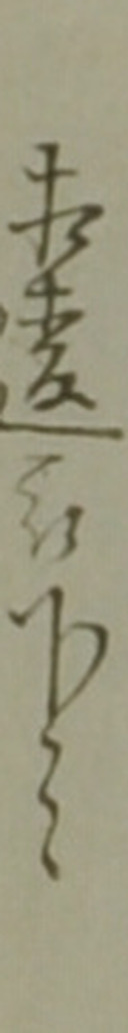相違被下之
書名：給人諸士勤仕録（三）
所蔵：伊那市立高遠町図書館・合同会社AMANE
